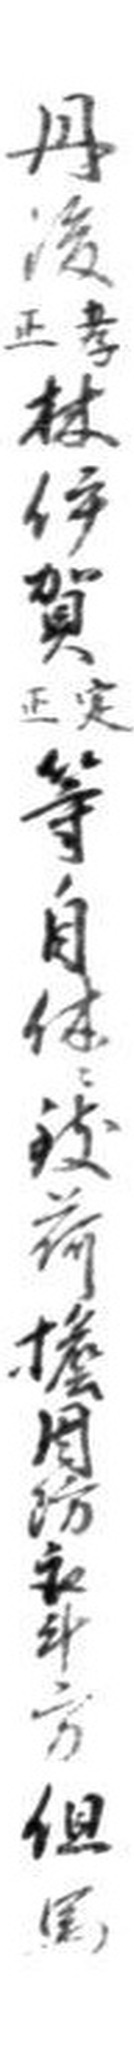正等自休ニ致荷担周防取計方但馬
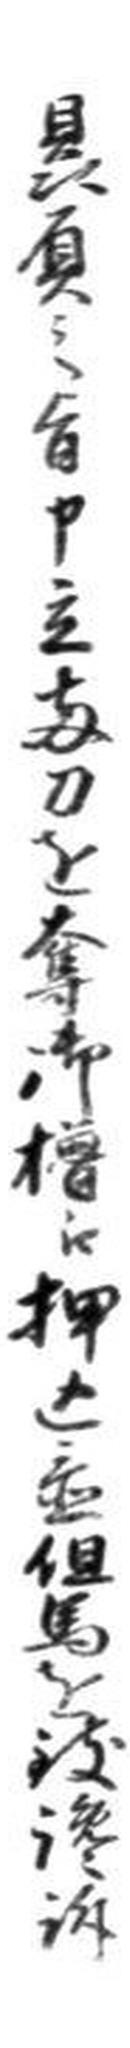贔屓之旨申立両刀を奪御櫓江押込置但馬を致讒訴
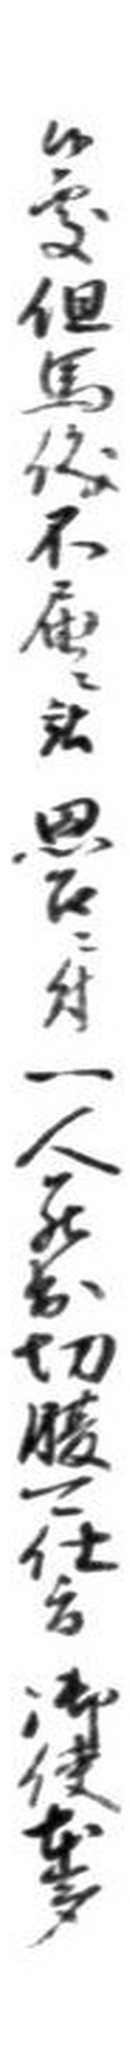候処但馬儀不届ニ被思召ニ付一人罷出切腹可仕旨御使本多
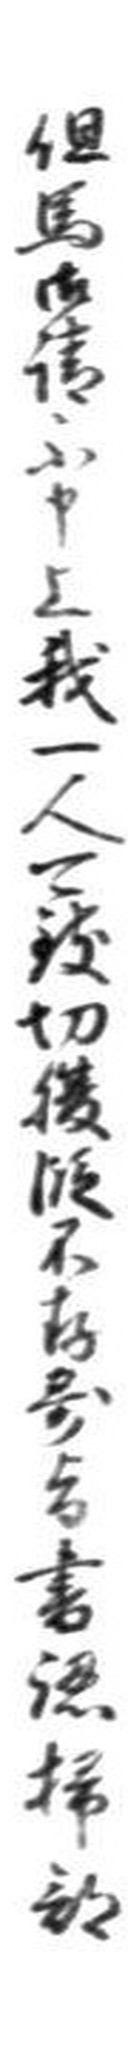但馬御請不申上我一人可致切腹段不存寄旨書認掃部
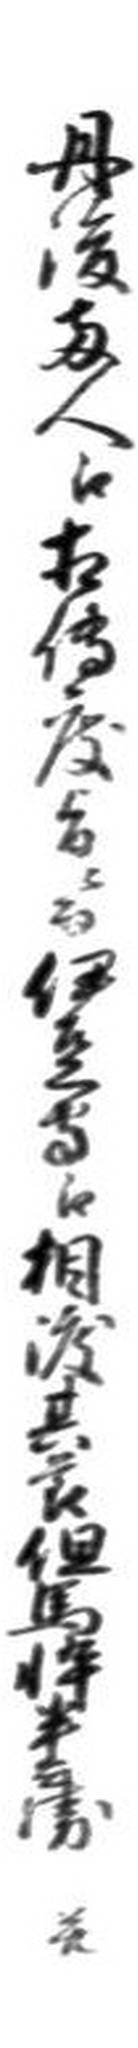丹後両人江相伝度旨ニ而伊豆守江相渡其節但馬忰半兵衛并
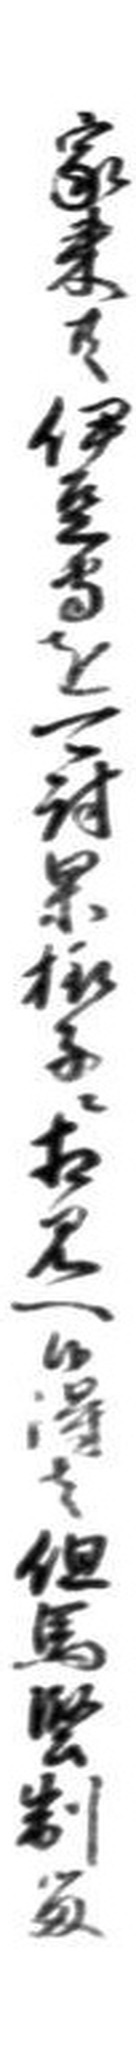家来共伊豆守を可討果様子ニ相見へ候得者但馬堅制留
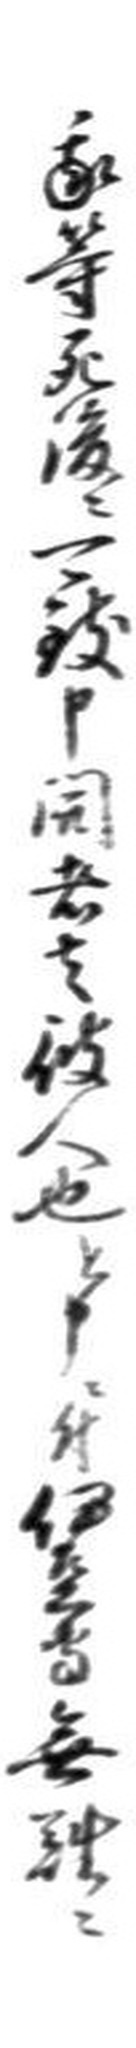我等死後ニ可致申開者者彼人也と申ニ付伊豆守無難ニ
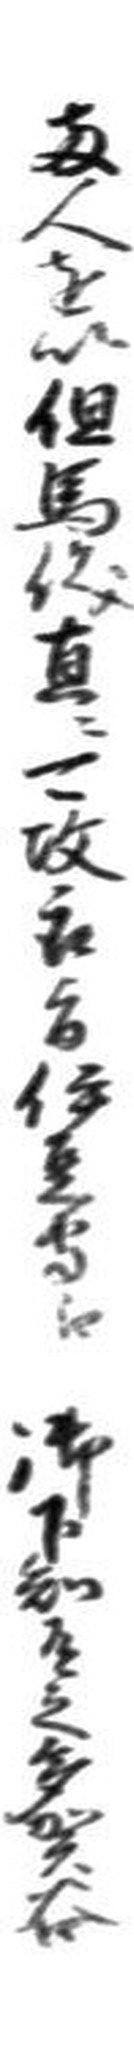両人を以但馬儀直ニ可攻取旨伊豆守江御下知有之多賀谷
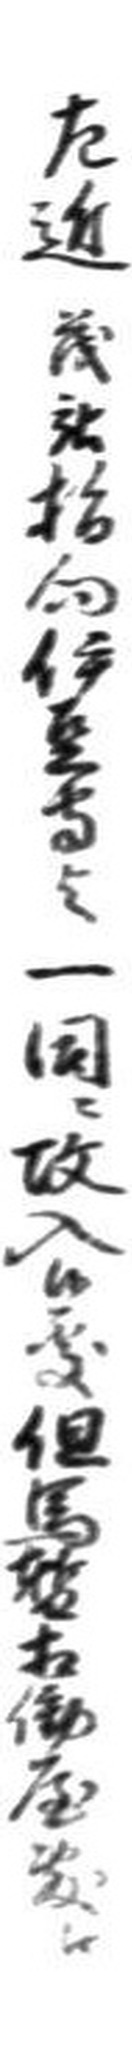左近茂被指向伊豆守与一同ニ攻入候処但馬暫相働屋敷江
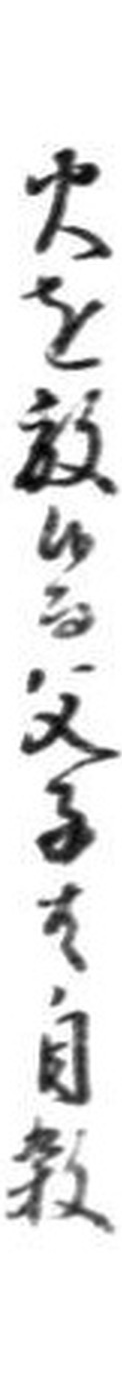火を放候而父子共自殺

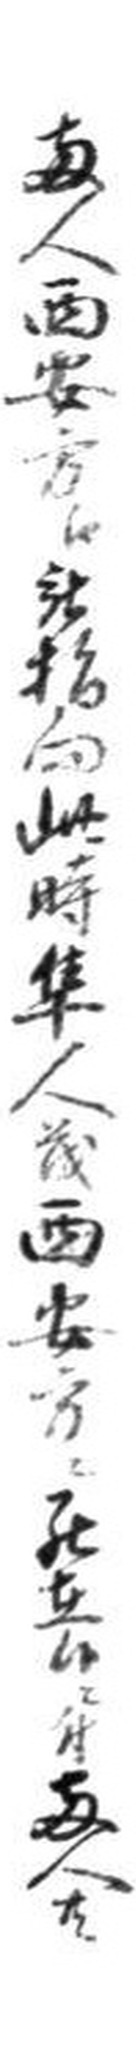両人西安方江被指向此時隼人茂西安方ニ罷在候ニ付両人共
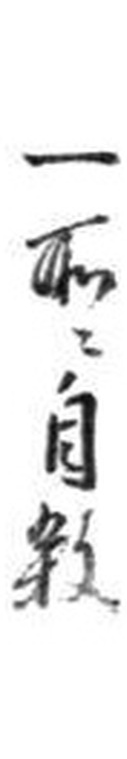一所ニ自殺
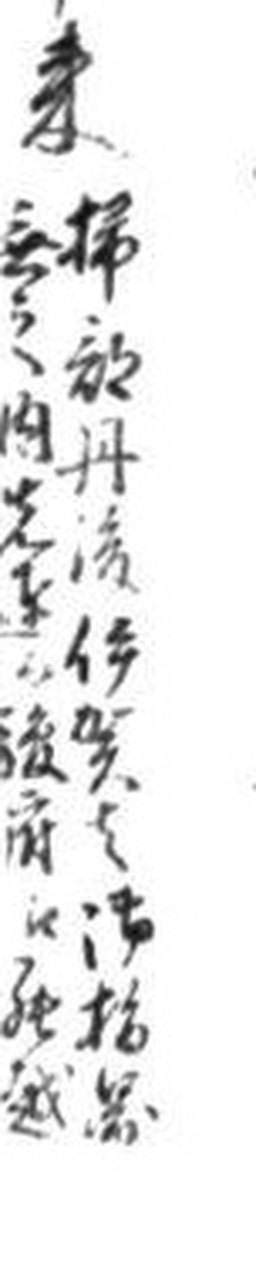無之内先達而駿府江罷越
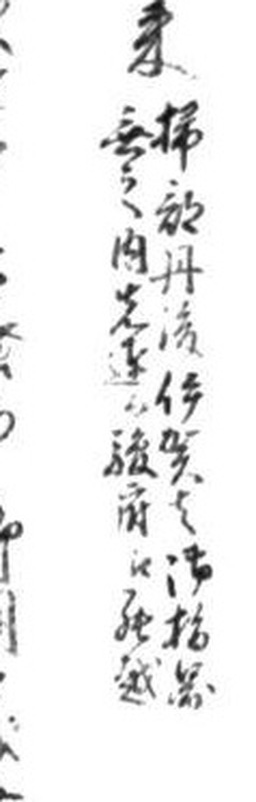無之内先達而駿府江罷越
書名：家譜 二 忠直公 従文禄四年到慶安四年
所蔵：福井県文書館 Fukui Prefectural Archives
